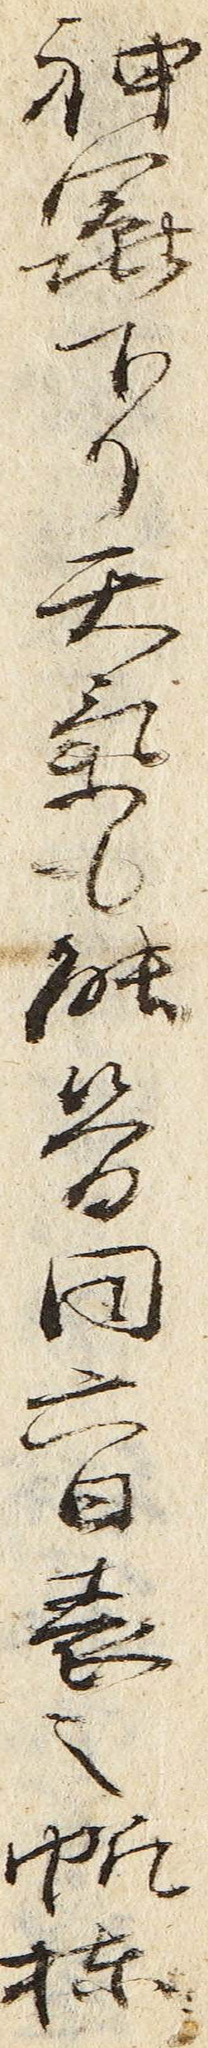神鬮下り天気も能候間同六日表之帆棟
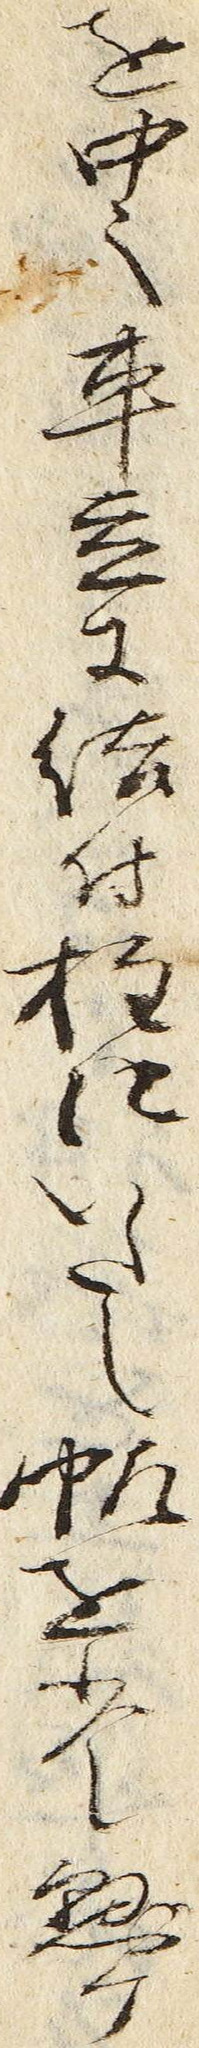を中之車立に結付柱にいたし帆を少し懸ヶ
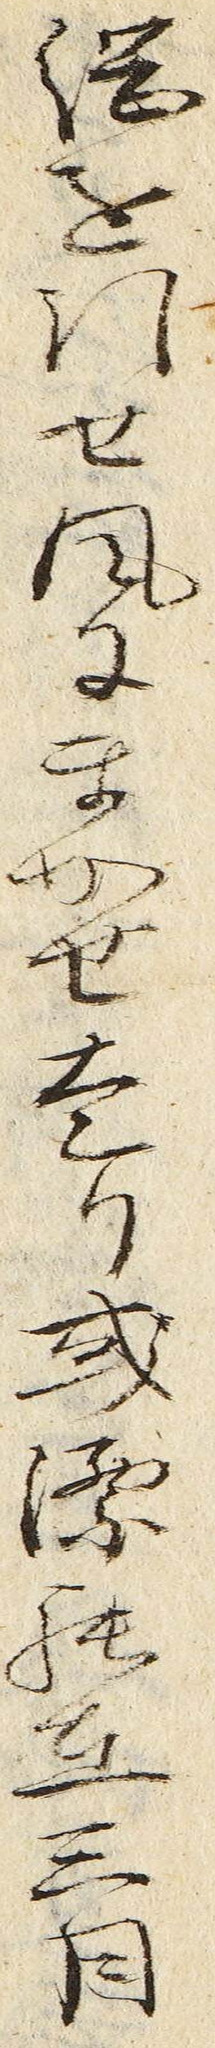綱を引せ風にまかせ走り或漂罷在三月
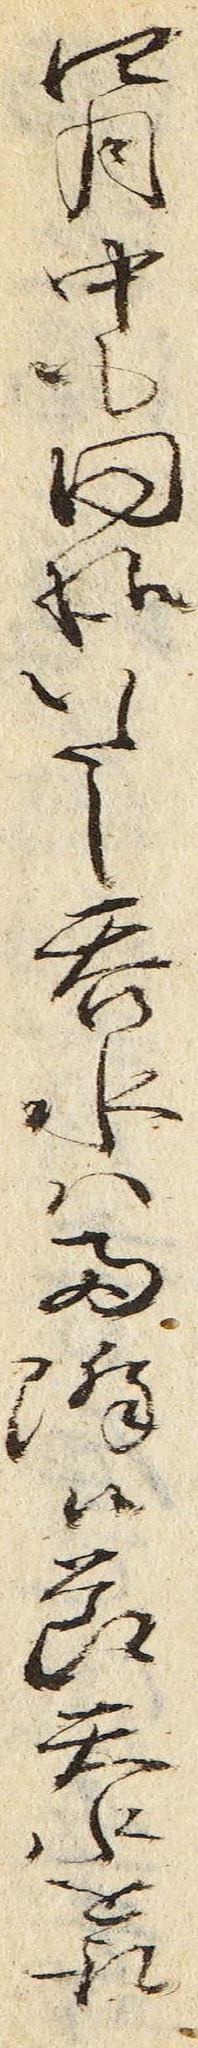四月中も同様いたし呑水は雨降候節天水を取

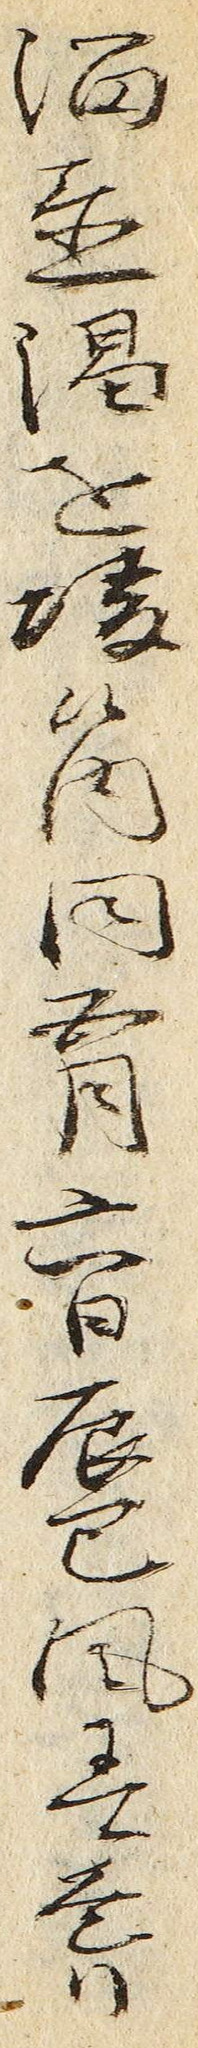溜置渇を凌候内同五月六日辰巳風にて走り
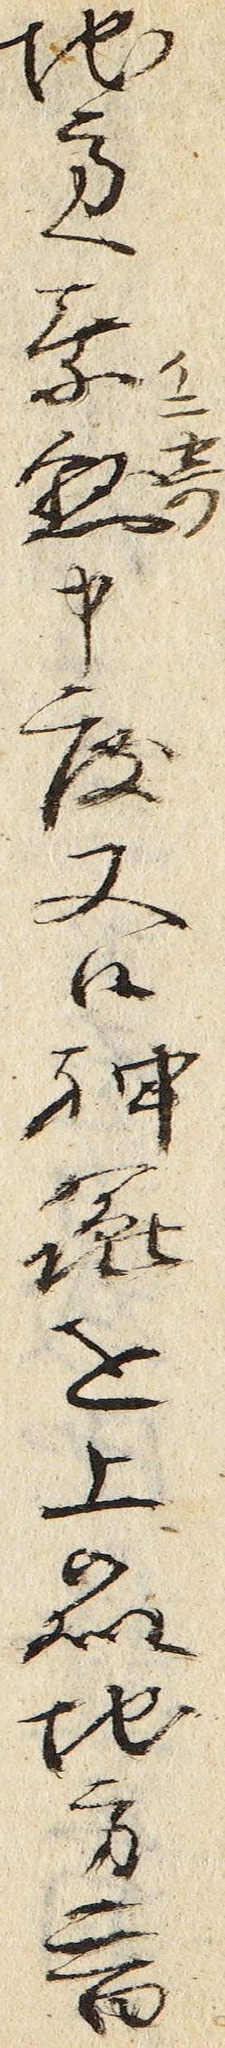地方へ乗懸申度又候神鬮を上候処地方二百
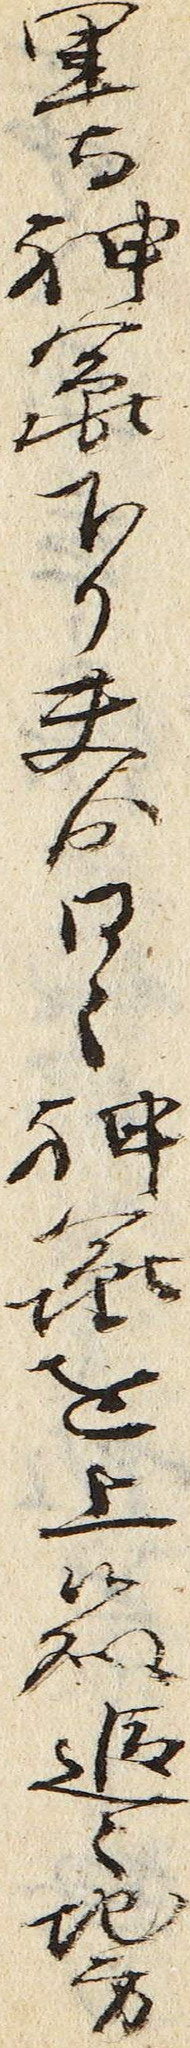里と神鬮下り夫ゟ日々神鬮を上候処追々地方
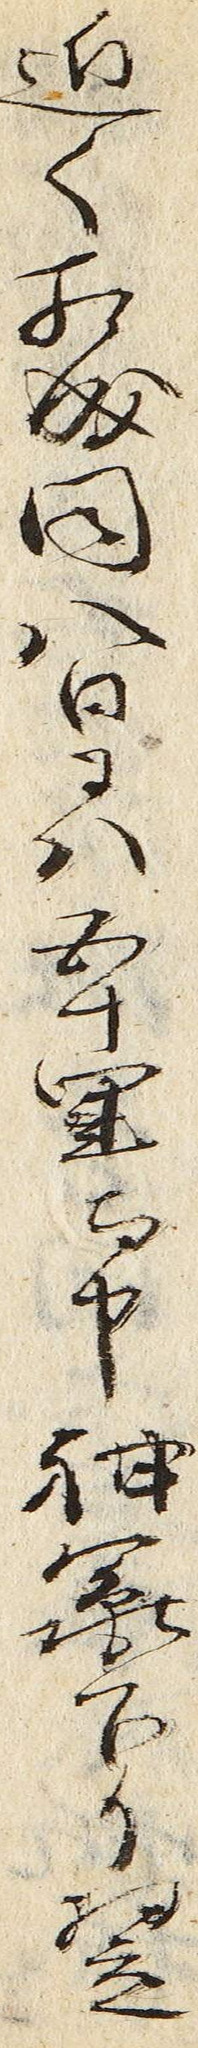近く相成同八日には五十里と申神鬮下り翌
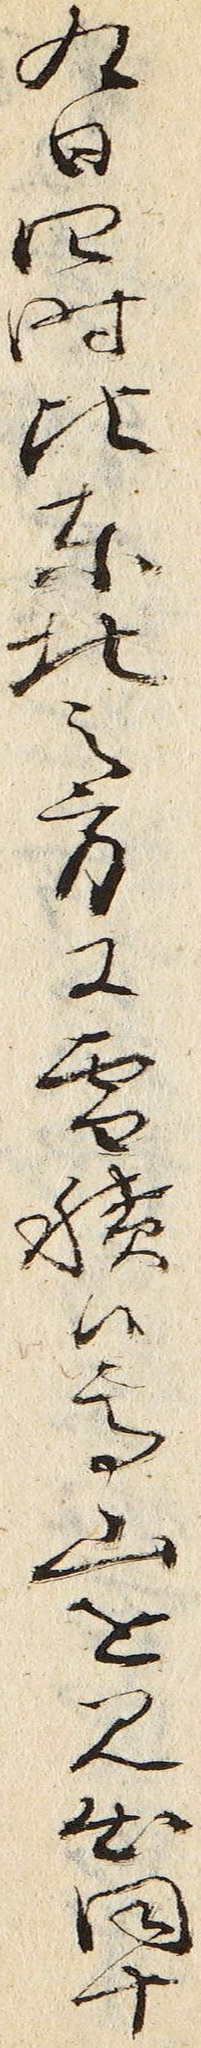九日四時比東北之方に雪積候高山を見出同十
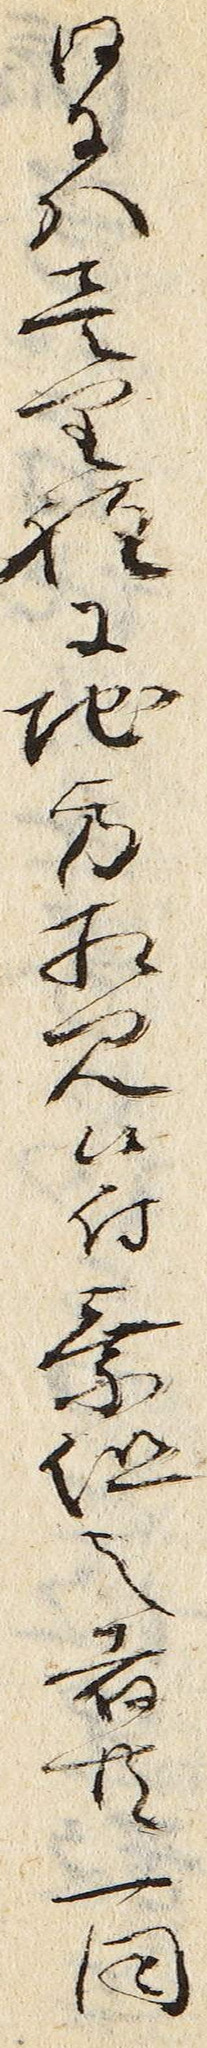日には壱里程に地方相見候付乗組之者共一同
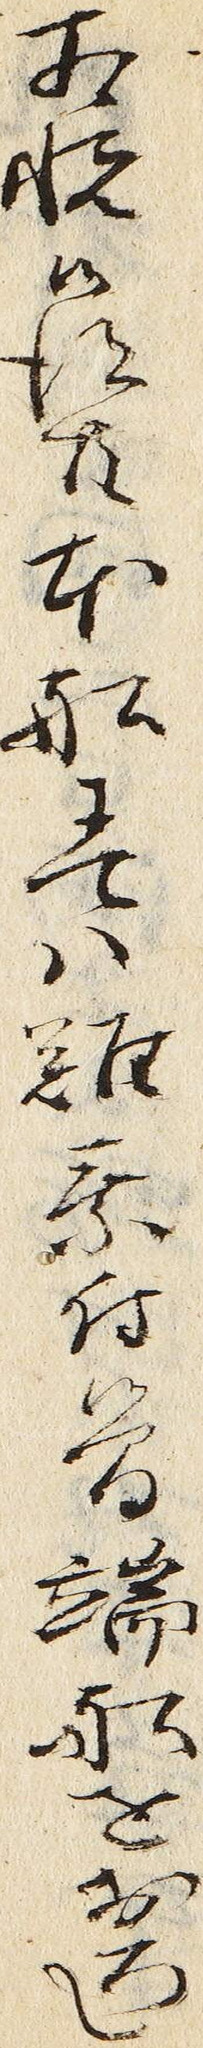相悦候得共本船にては難乗付候間端船をおろし
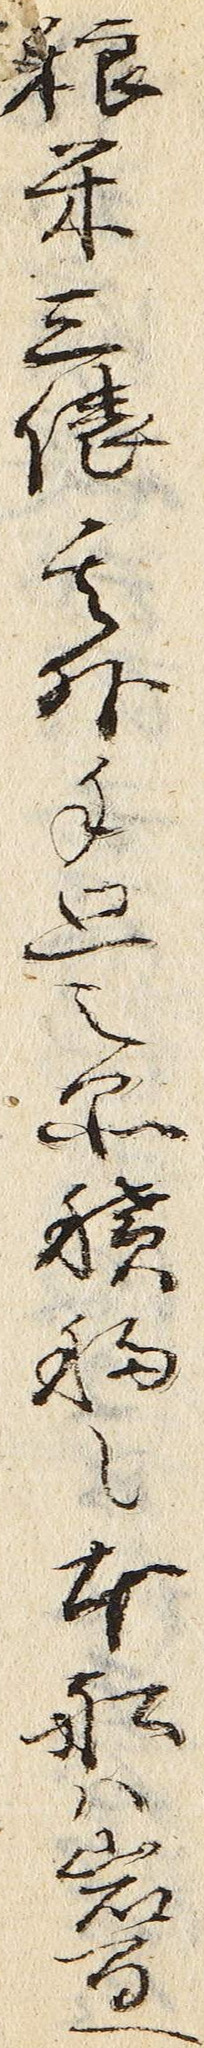粮米三俵其外手廻之品積移し本船は岩間へ
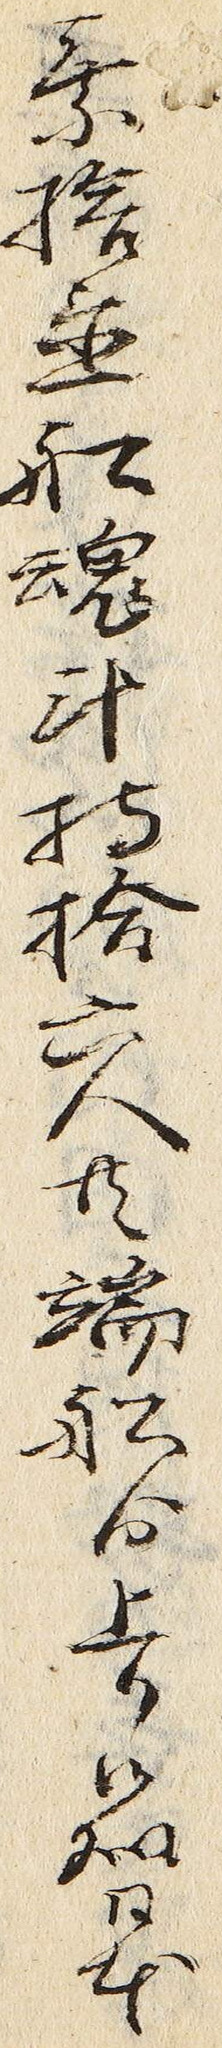乗捨置船魂斗持拾六人共端船ゟ上り候処日本
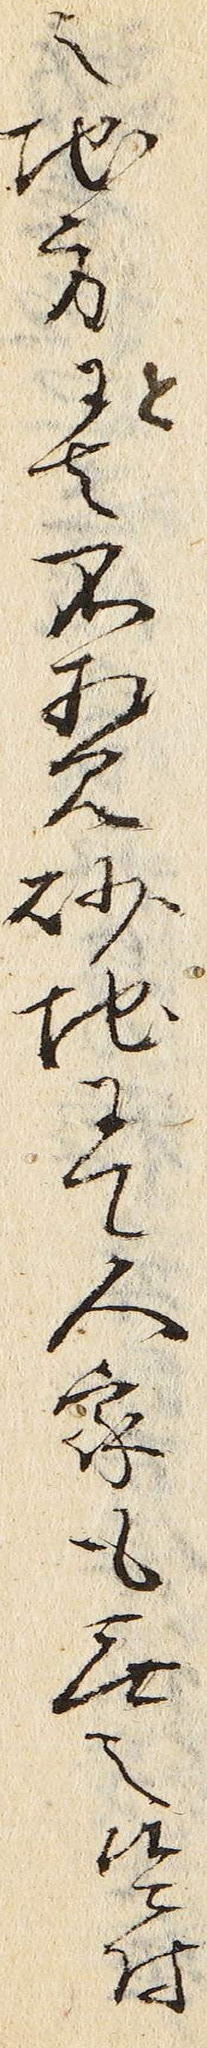之地方には不相見砂地にて人家無之候に付
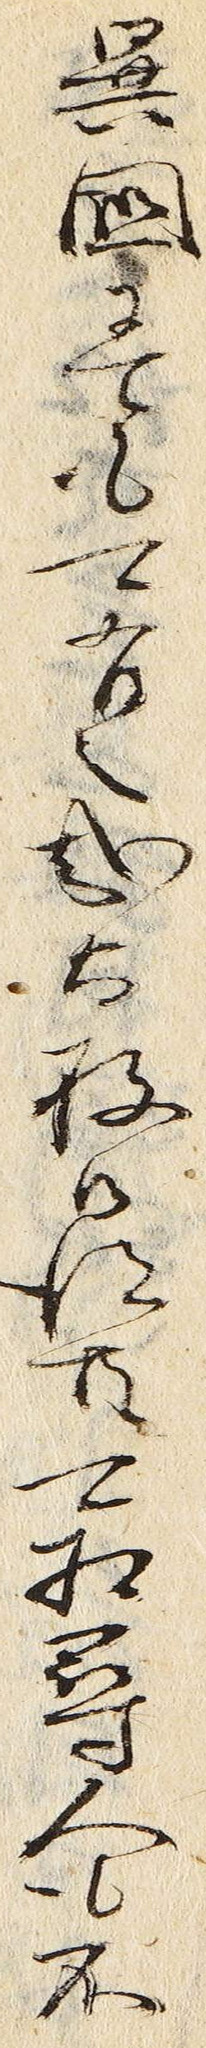異国にても可有之哉と存候得共可相尋人も不
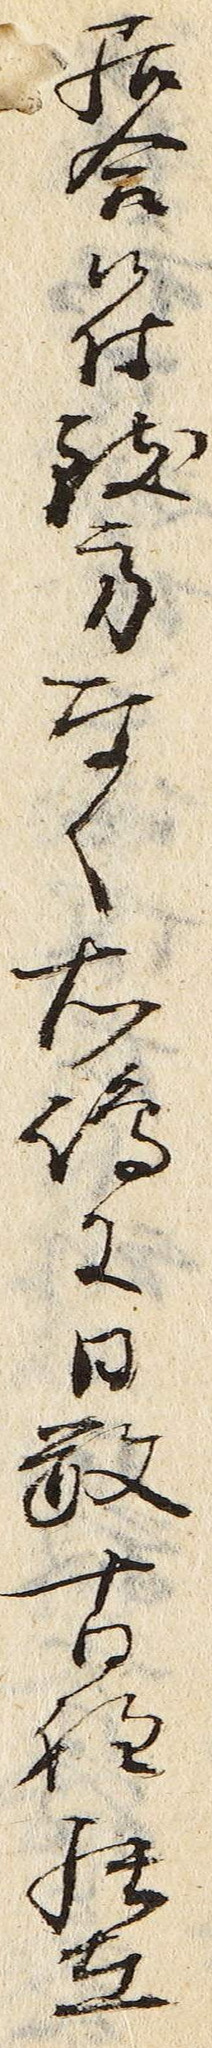居合候付致方なく右島に日数十日程罷在
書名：漂民後記
